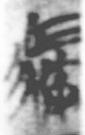○（服）
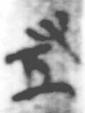○（右）
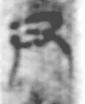尹
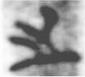之
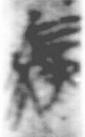駟
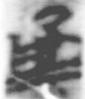爲
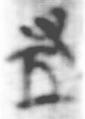○（右）
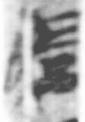驂
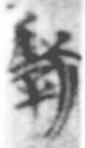新（新）
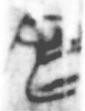官
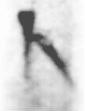人
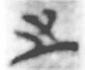之
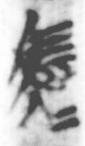駟
